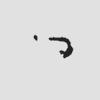夕
